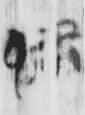𫵖
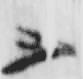之
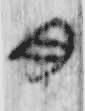月
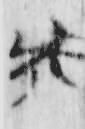癸
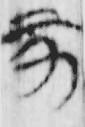亥
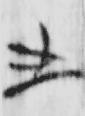之
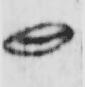日
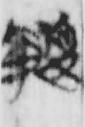執
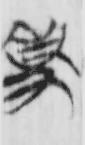事
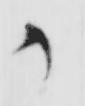人
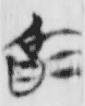爲
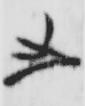之
